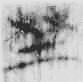埜（野）
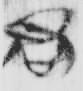君
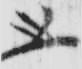之
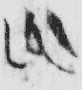州
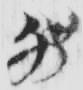加
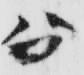公
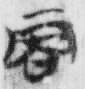丙
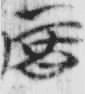晨
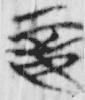妾
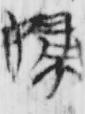婦
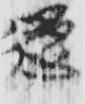迻
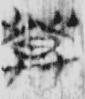登
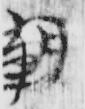軍
